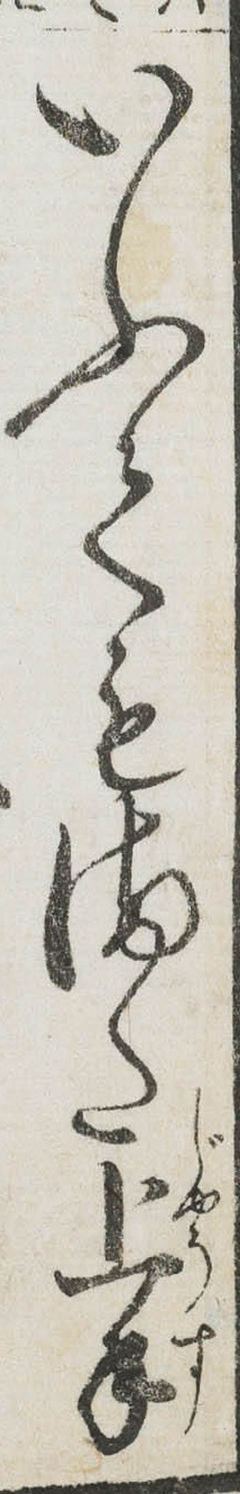いふてもまた上手
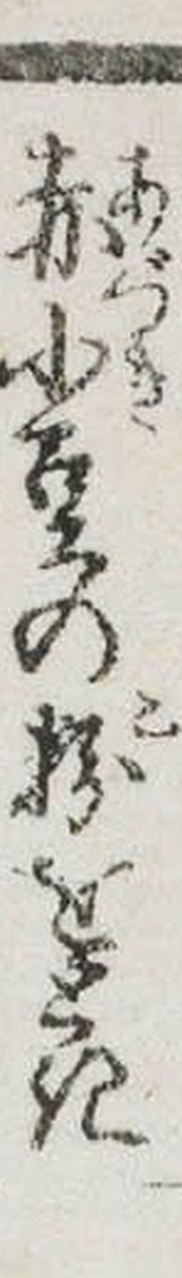赤小豆の粉をとき
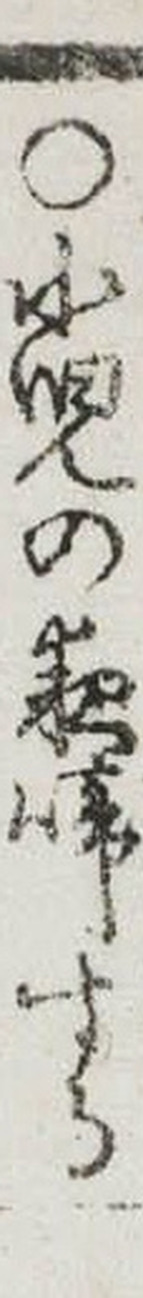○小児の夜啼する
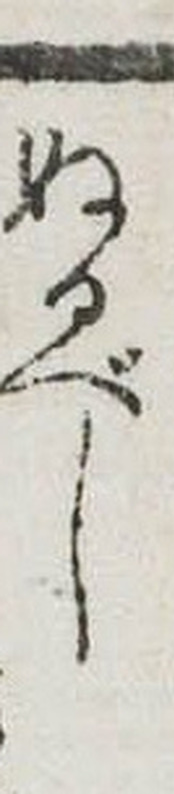ぬるべし
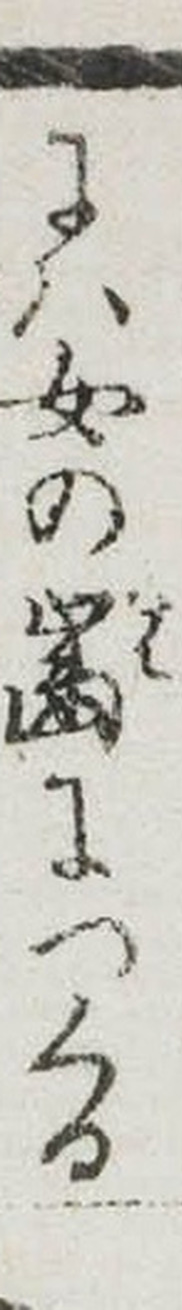には女の歯につくる
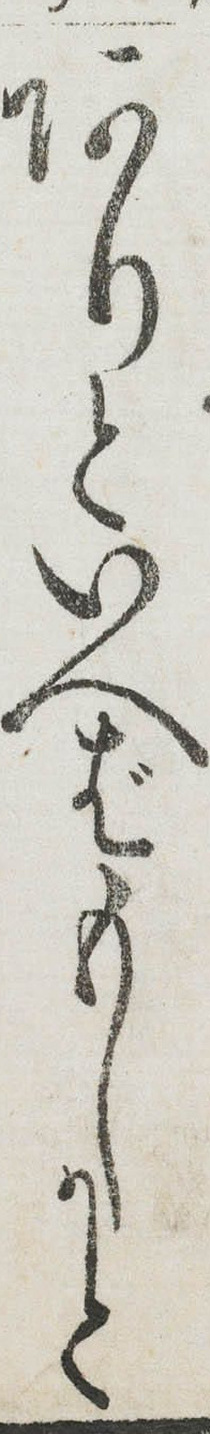ありといへばもしかと
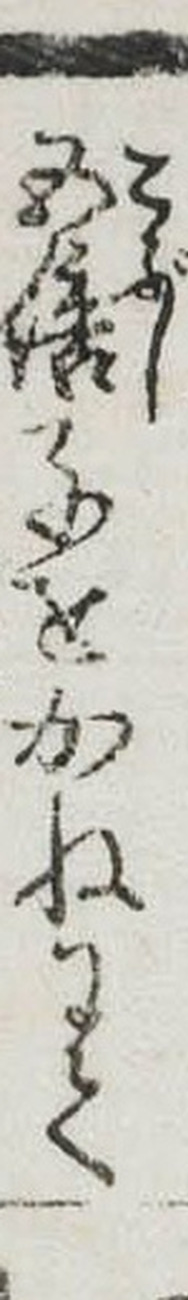五倍子をかねにて
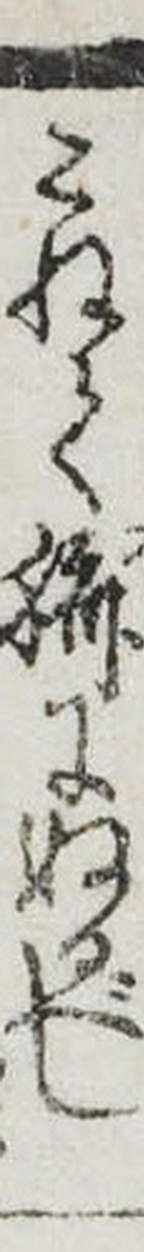こねて臍にぬるべし
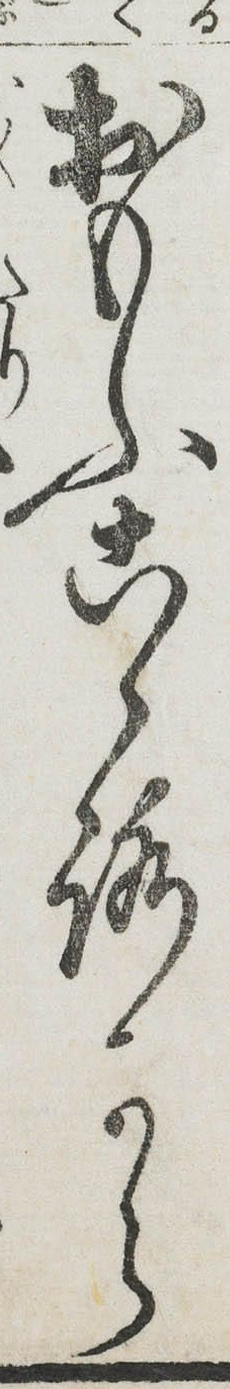おもふこゝろから
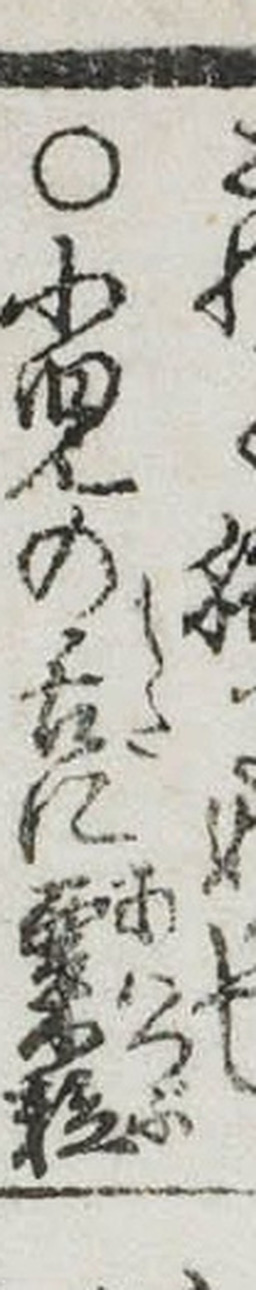○小児の舌に粟粒
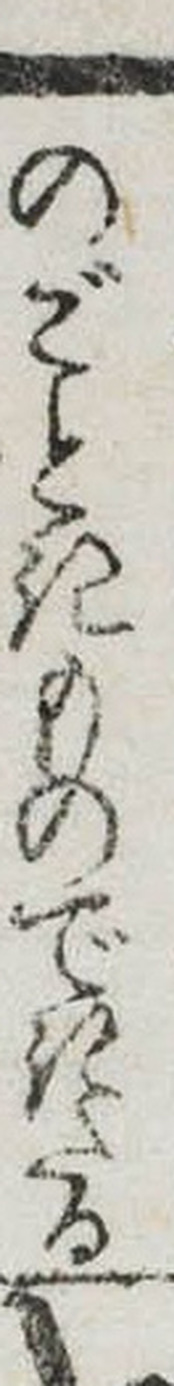のごときものできたる
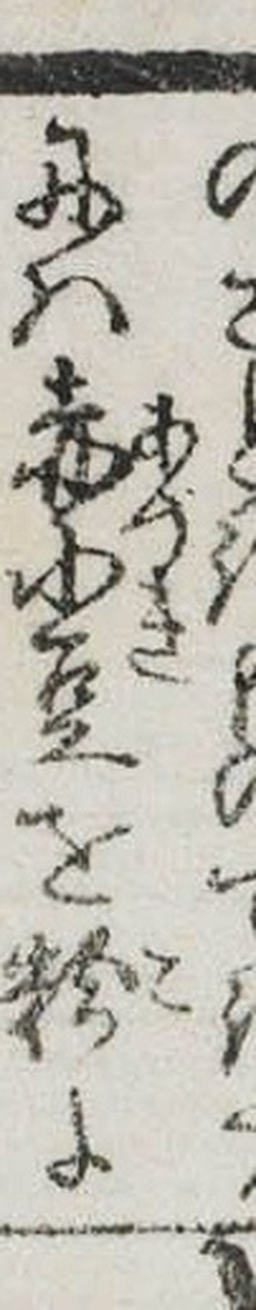には赤小豆を粉に
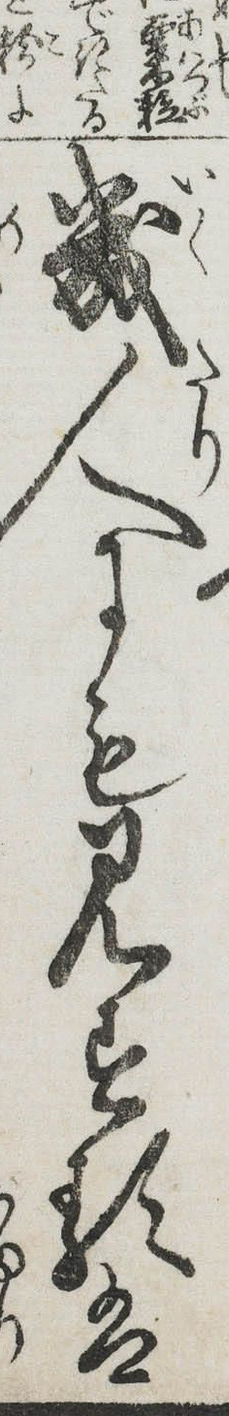幾人にも見するは
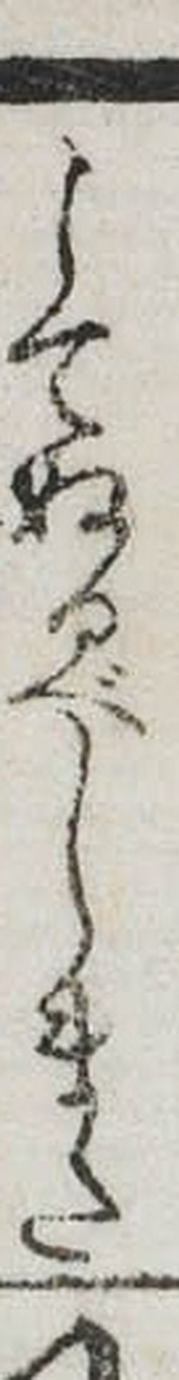してぬるべしまた
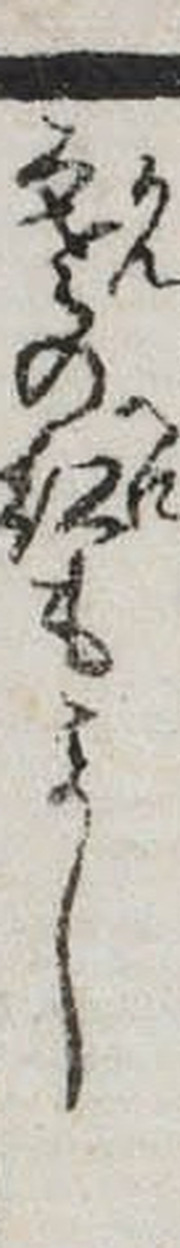寒の紅もよし
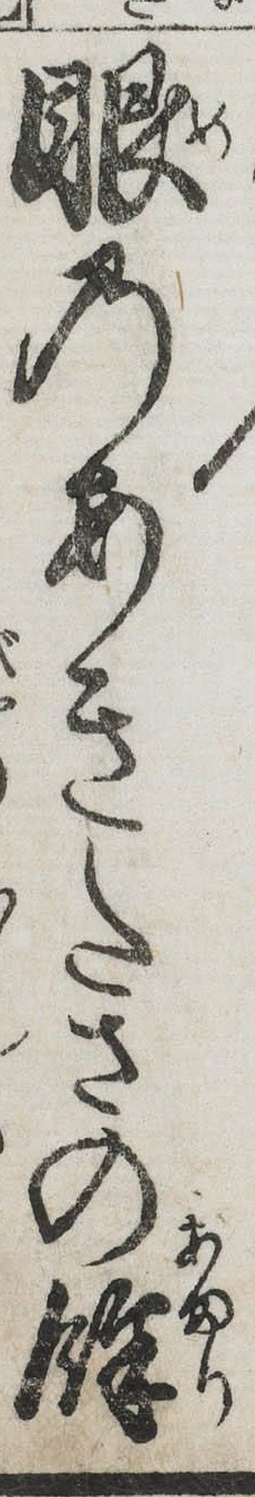眼のあきたさの余
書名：頭書萬用婦人手紙之文言
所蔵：東京学芸大学教育コンテンツアーカイブ
